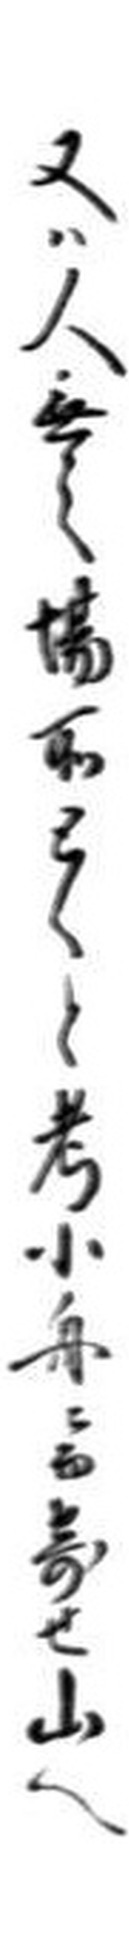又ハ人無之場所とくと考小舟ニ而寄せ山へ
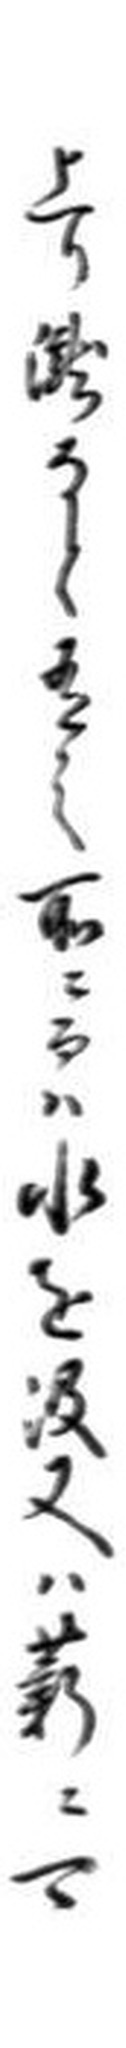上り瀧なと有之所ニ而ハ水を汲又ハ薪ニ可
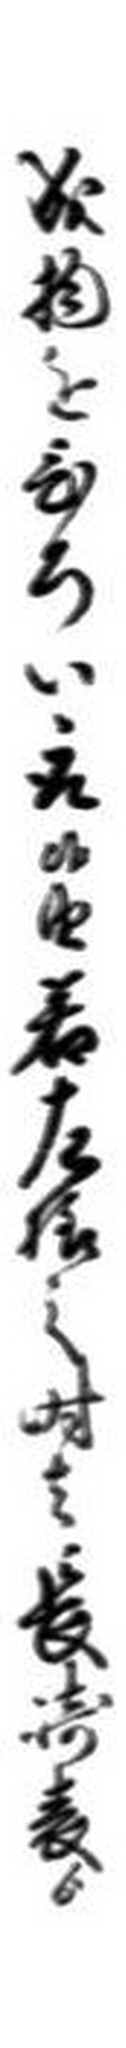成物をひろい取候由若左様之時者長崎表ゟ
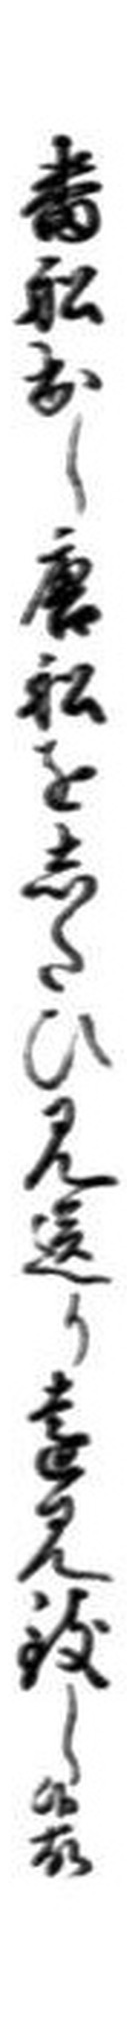番船出し唐船をしたひ見送り遠見致し候故
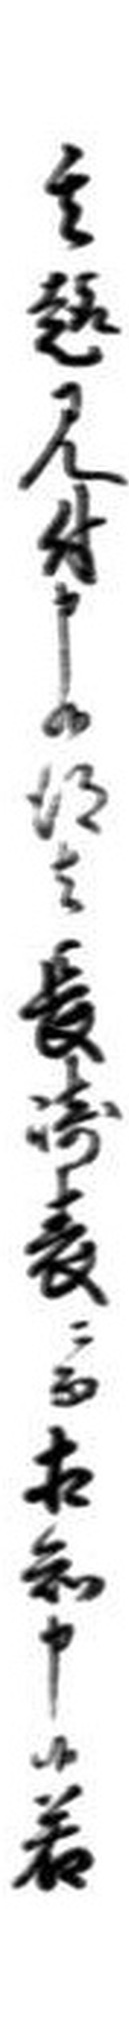其趣見付申候得者長崎表ニ而相知申候若
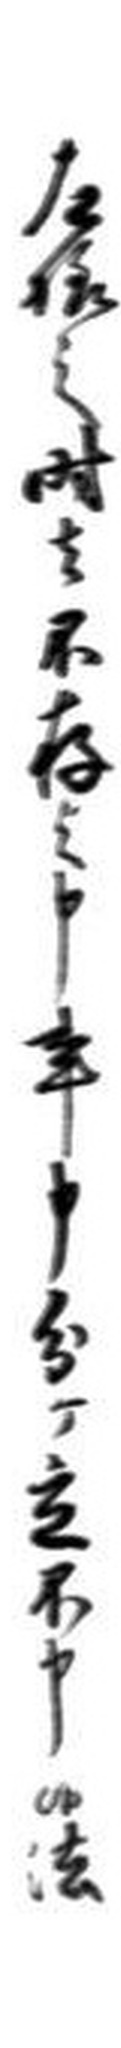左様之時者不存与申事申分ケ立不申候法
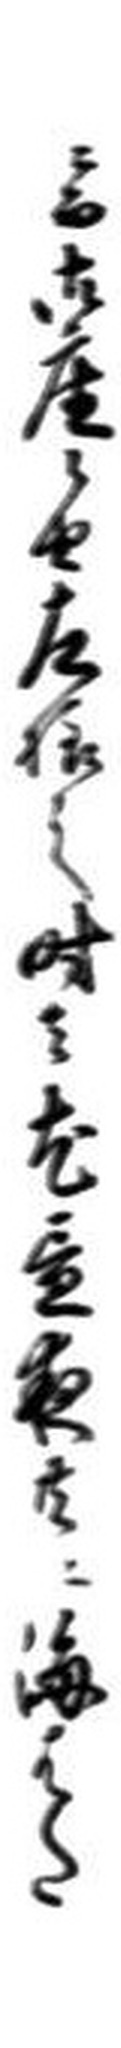ニ而御座候由左様之時者尤昼夜共ニ海はた

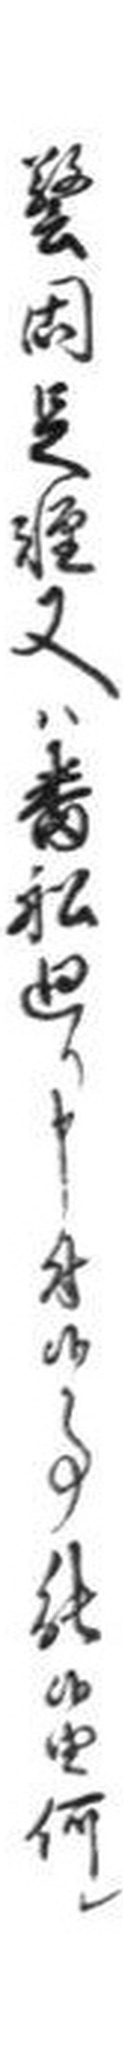警固足軽又ハ番船廻り申付候事能候由何レ
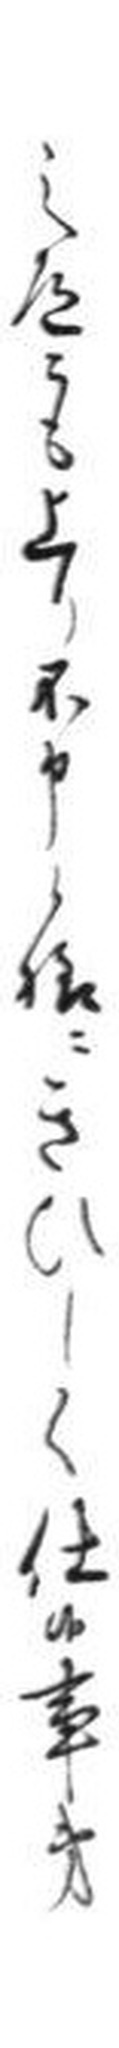之道ニも上り不申候様ニきひしく仕候事第
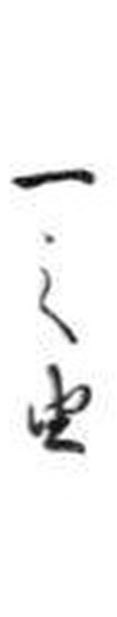一之由
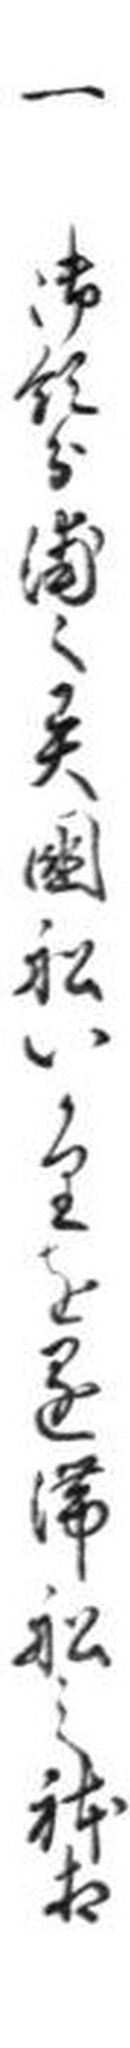一御領分浦々異国船いかりを懸滞船之体相
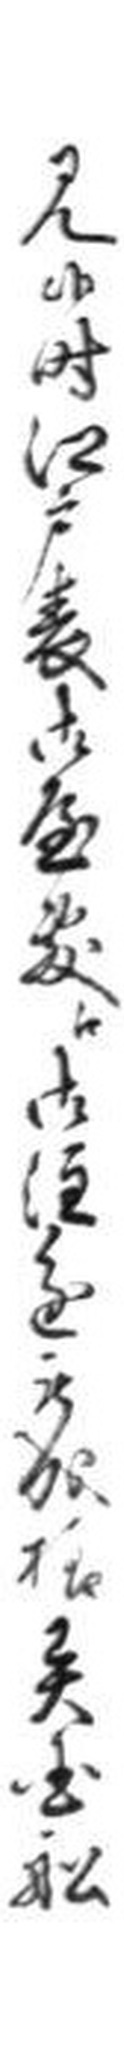見候時江戸表御屋敷江御注進被成様異国船
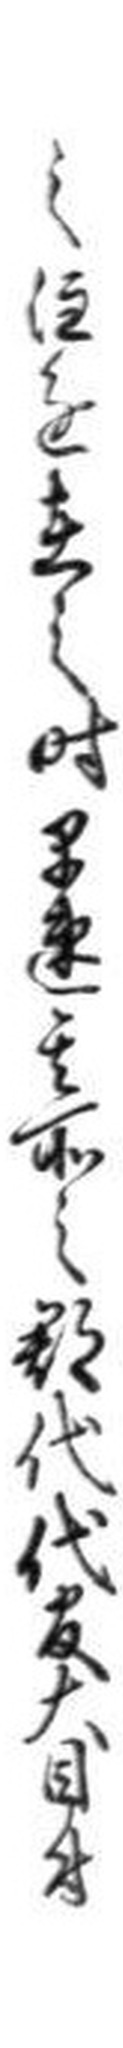之注進在之時早速其所之郡代代官大目付
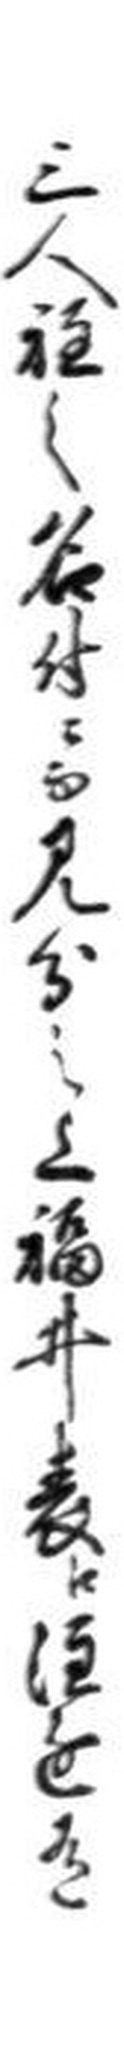三人程之名付ニ而見分之上福井表江注進有
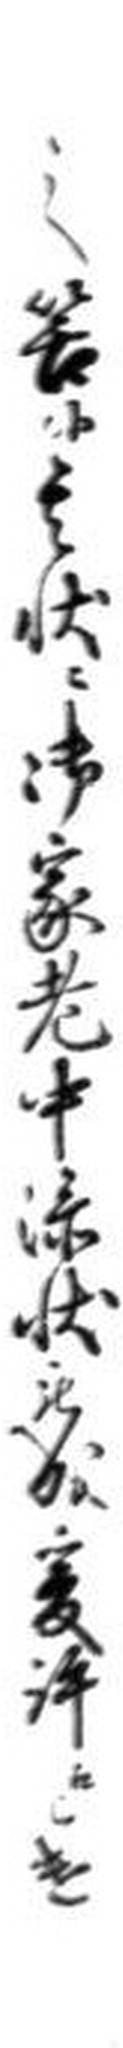之筈候其状ニ御家老中添状被成爰許江被遣
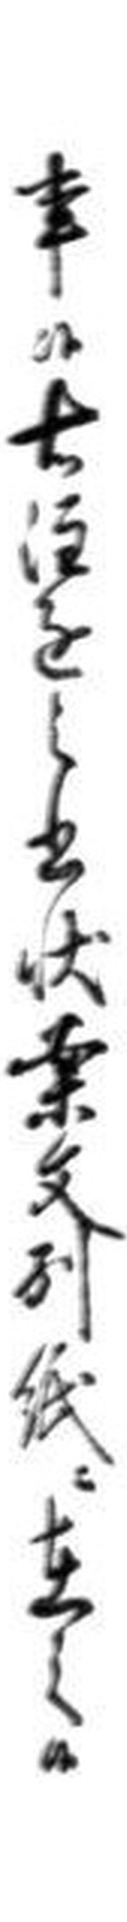事候右注進之書状案文別紙ニ在之候
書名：家譜 三十二 吉邦公 従享保二年到享保三年
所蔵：福井県文書館 Fukui Prefectural Archives
